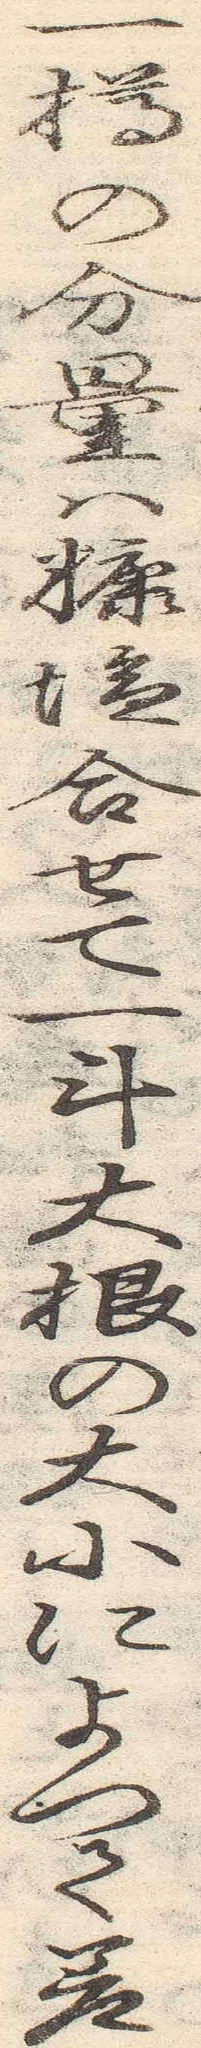一樽の分量は糠塩合せて一斗大根の大小によつて差
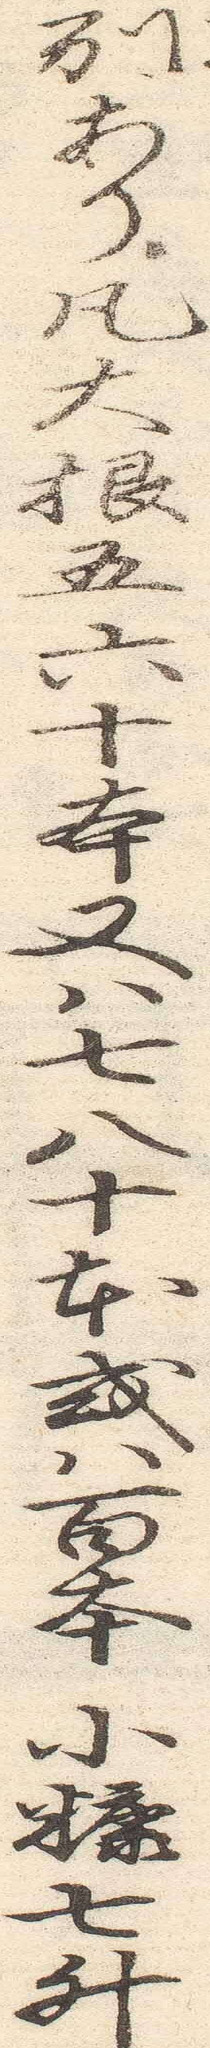別あり凡大根五六十本又は七八十本或は百本小糠七升
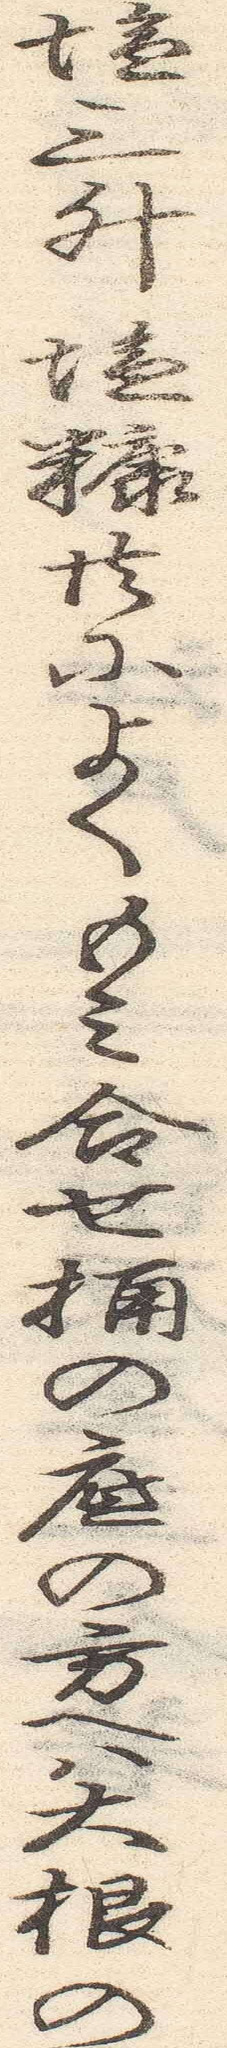塩三升塩糠共によくもみ合せ桶の底の方へは大根の
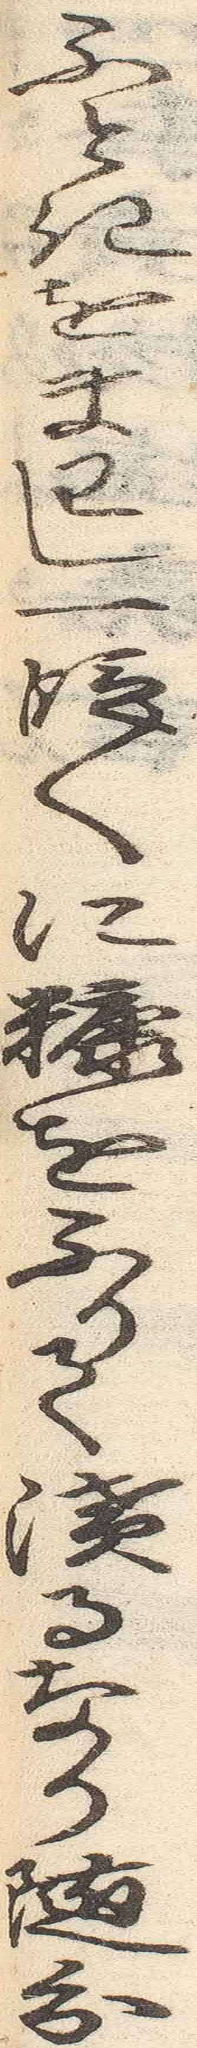ふときをまわし一段〳〵に糠をふりて漬るなり随分
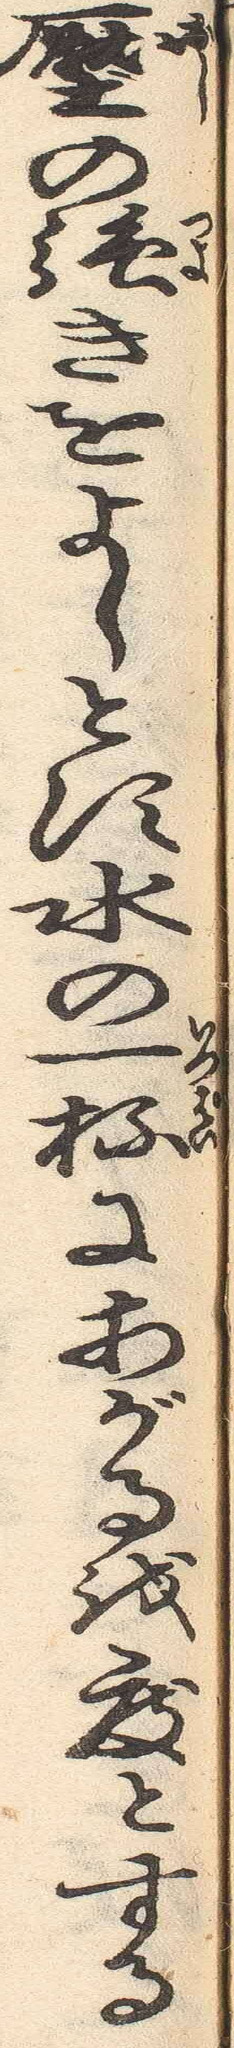圧の強きをよしとす水の一杯にあがるを度とする
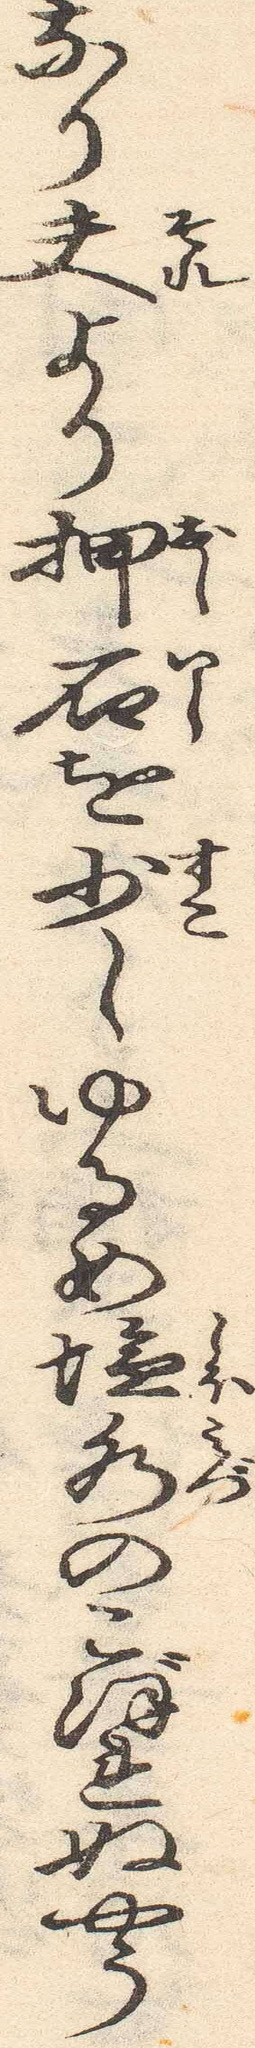なり夫より押石を少しゆるめ塩水のこぼれぬやう
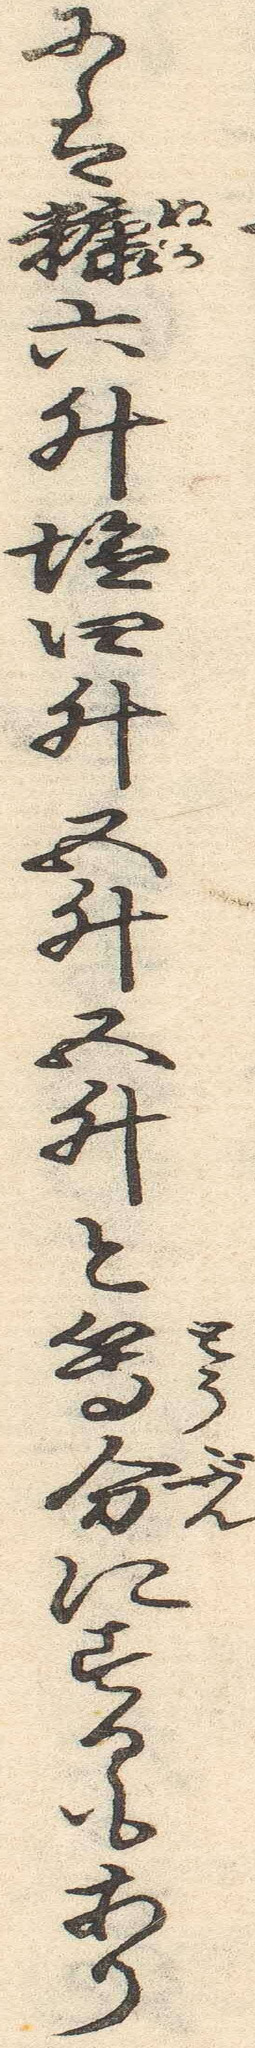には糠六升塩四升五升五升と等分にするもあり
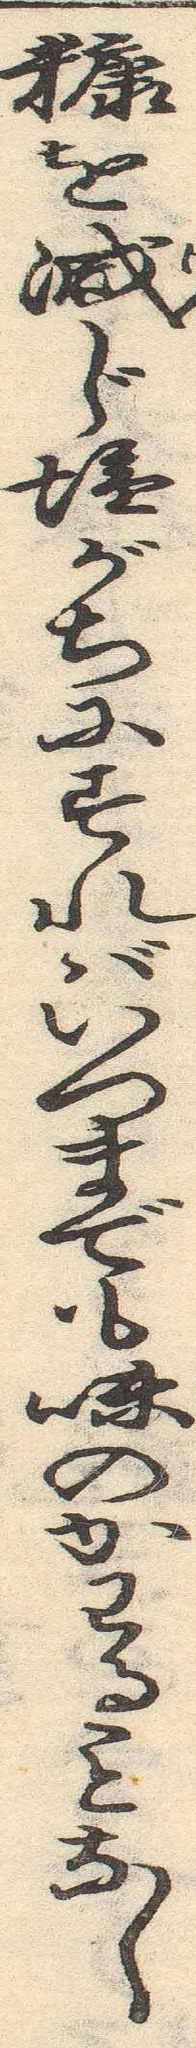糠を減じ塩がちにすればいつまでも味のかわることなし
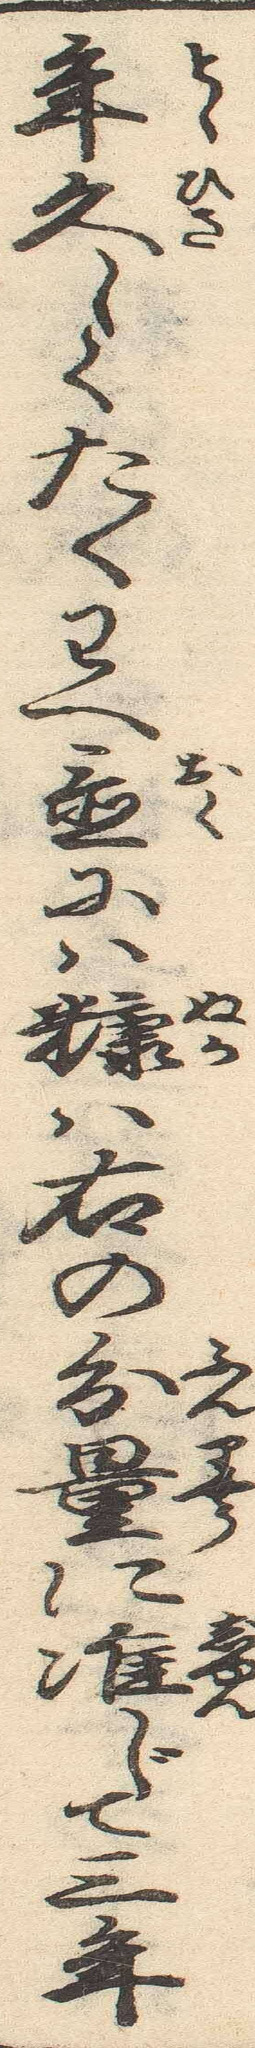年久しくたくわへ置には糠は右の分量に准じて三年

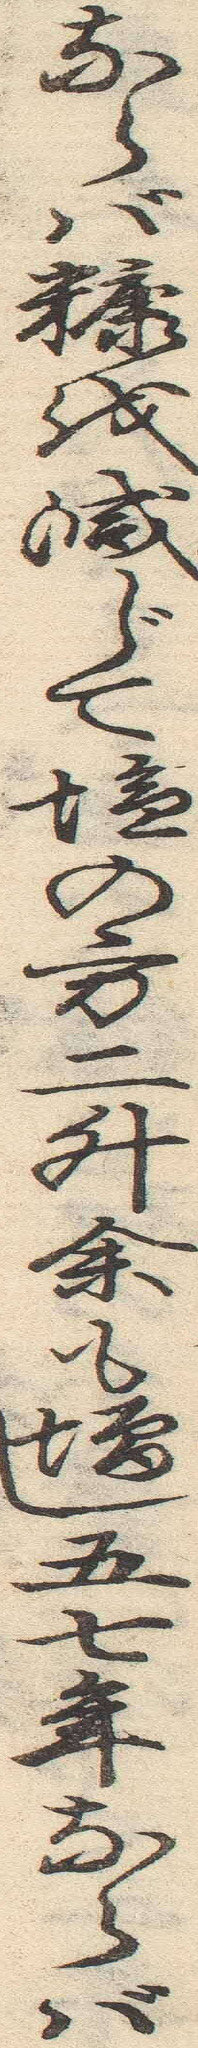ならば糠を減じて塩の方二升余も増し五七年ならば
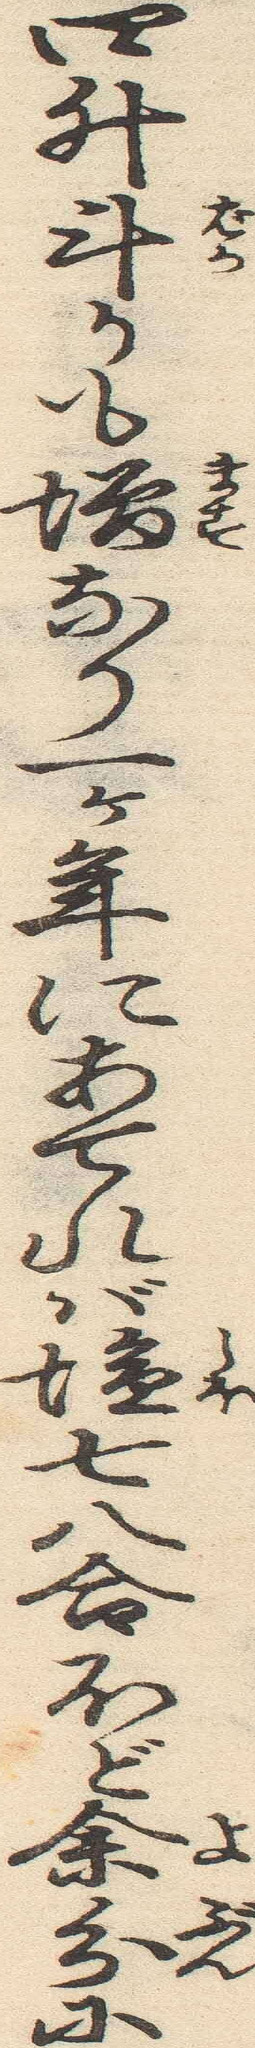四升斗りも増すなり一ヶ年にあてれば塩七八合ほど余分に
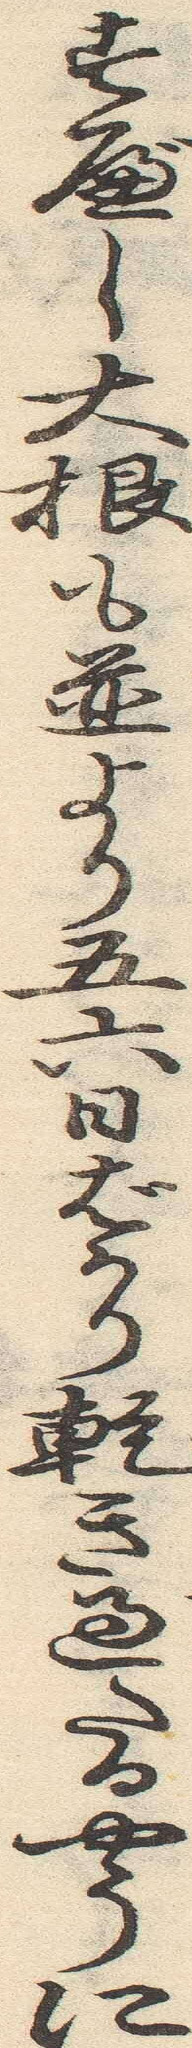すべし大根も並より五六日ばかり乾き過たるやうに
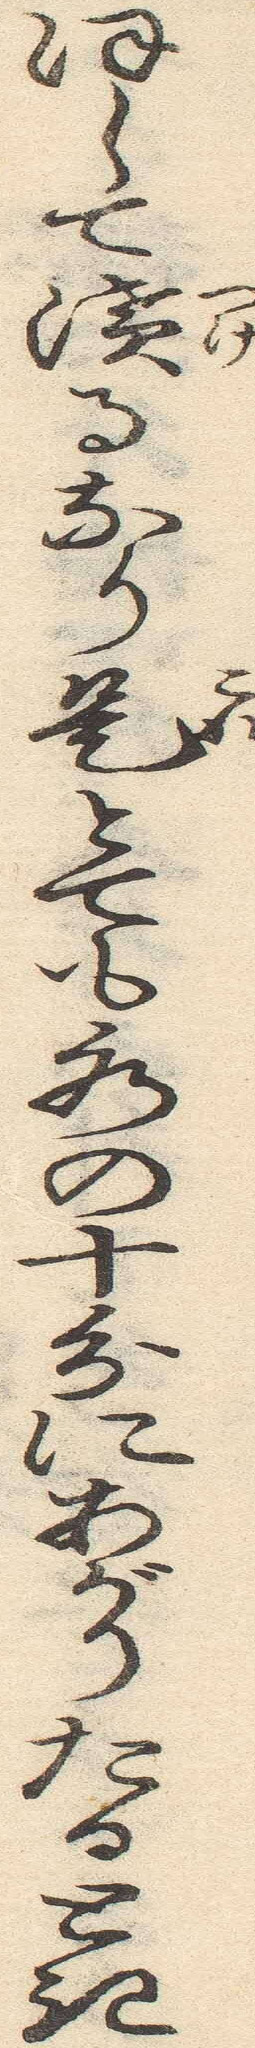ほして漬るなり是とても水の十分にあがりたるとき
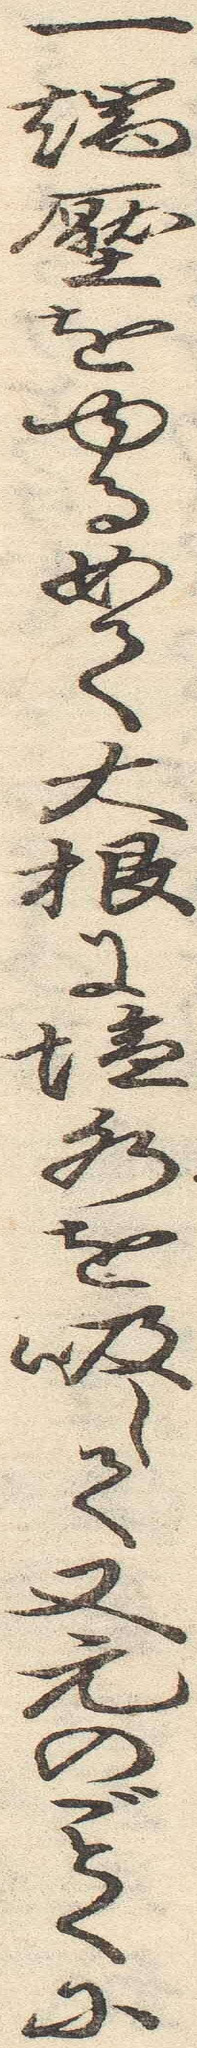一端圧をゆるめて大根に塩水を吸して又元のごとくに
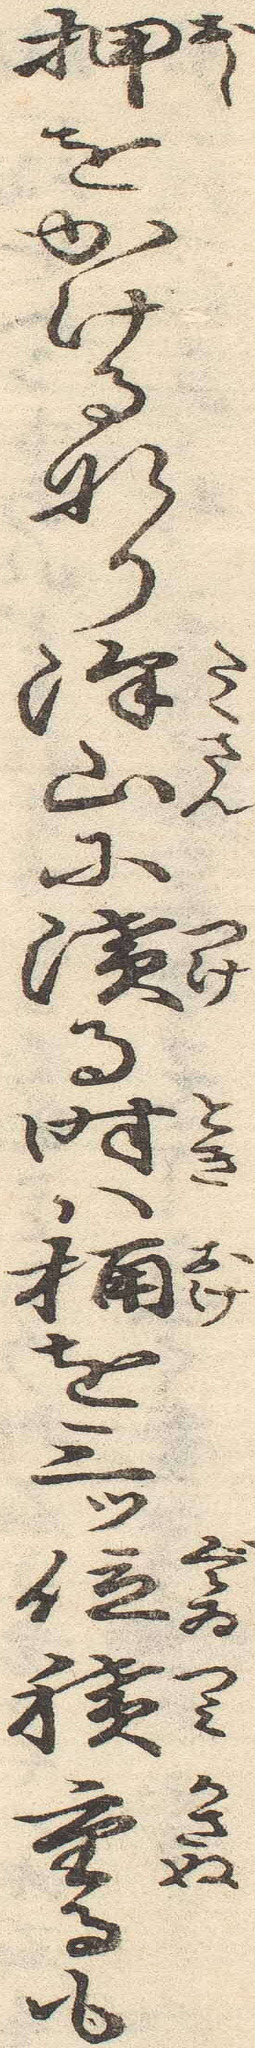押をかけるなり沢山に漬る時は桶を三ッ位積重るも
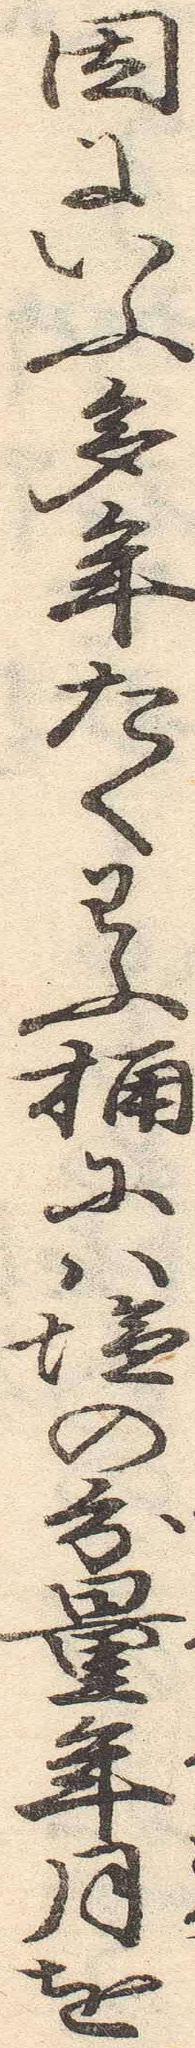因にいふ多年たくわふ桶には塩の分量年月を
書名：四季漬物塩嘉言
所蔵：東京学芸大学附属図書館 国文学研究資料館
